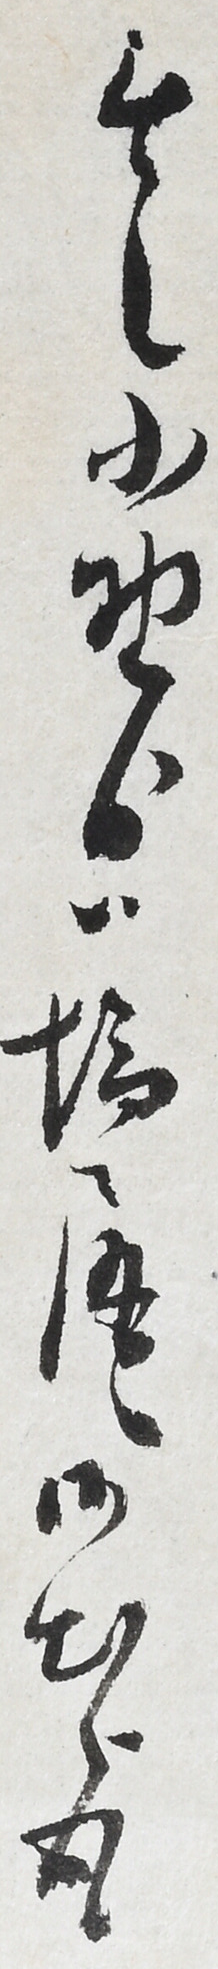無之小野ゟハ塩尻へ御出被成候
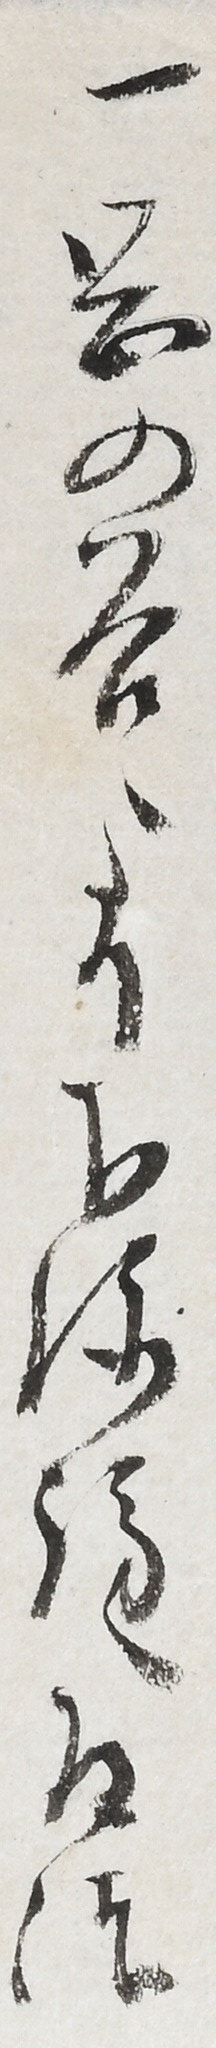一岡の谷より下諏訪へ道法
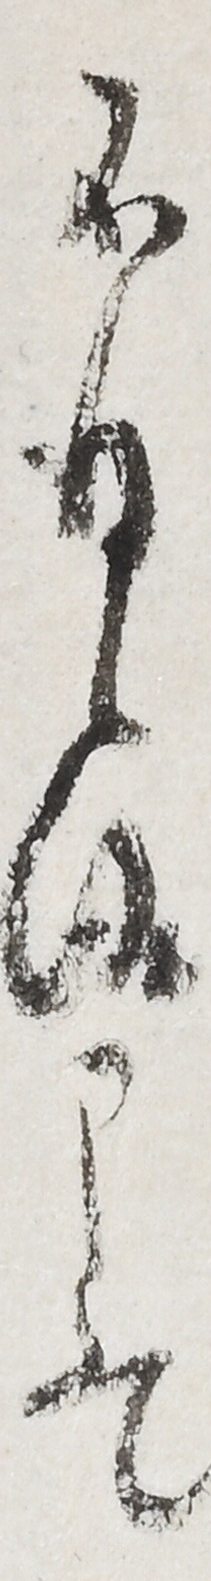不存候趣申上候
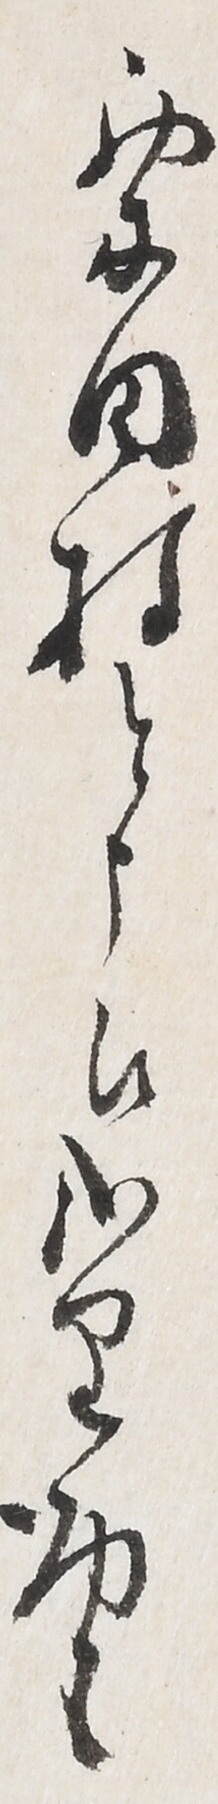栗田村と申凡弐里御座候
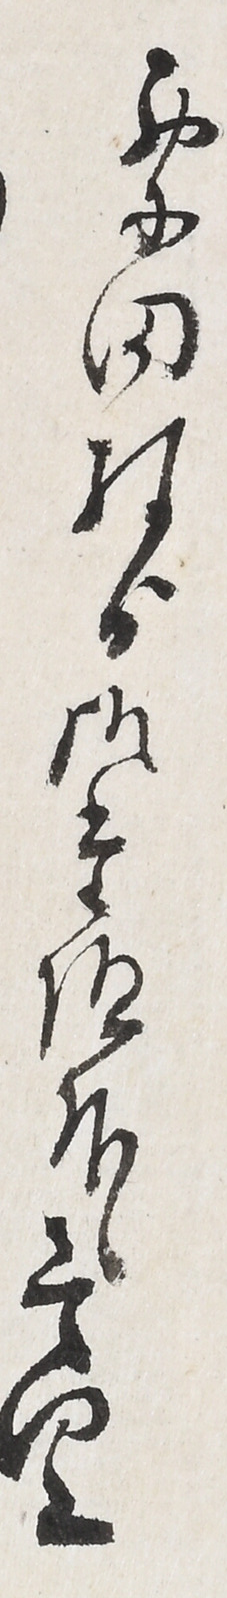栗田村ゟ御堂垣外へ壱里
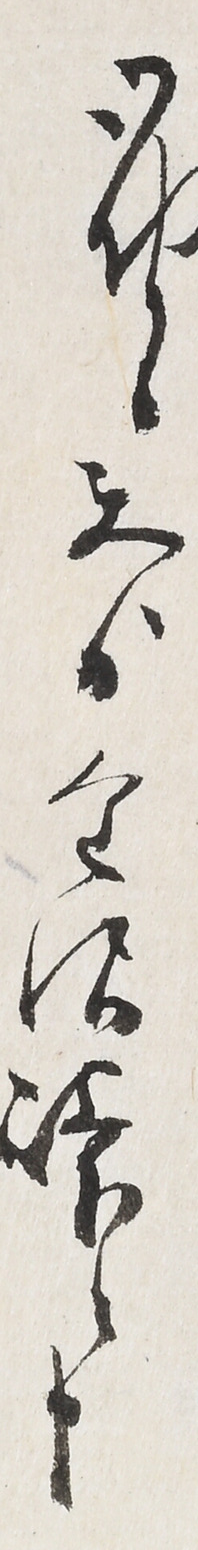御座候夫ゟ金沢峠と申
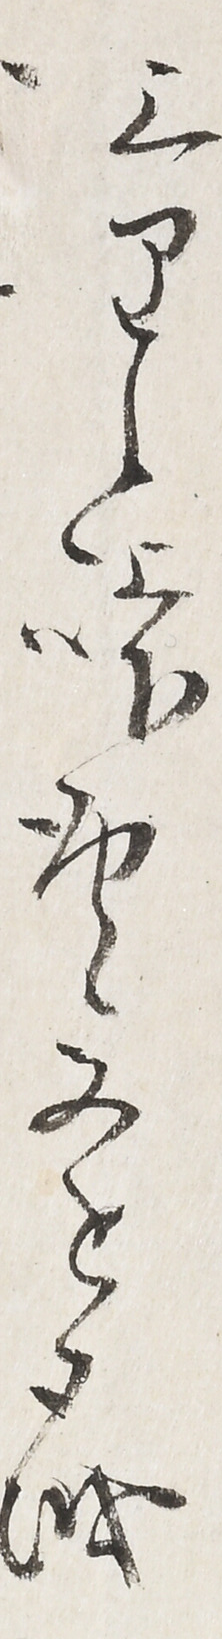三里之峠御座候夫を御越
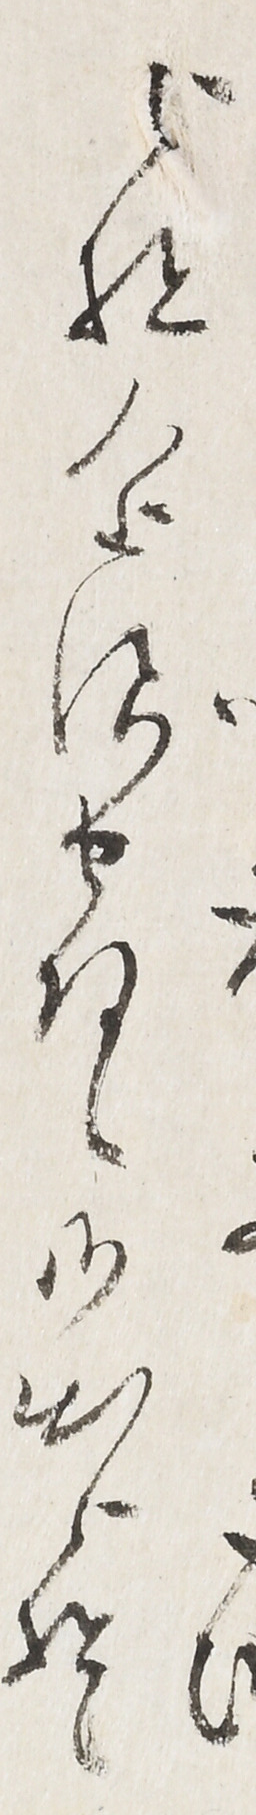被遊金沢宿へ御出被遊候
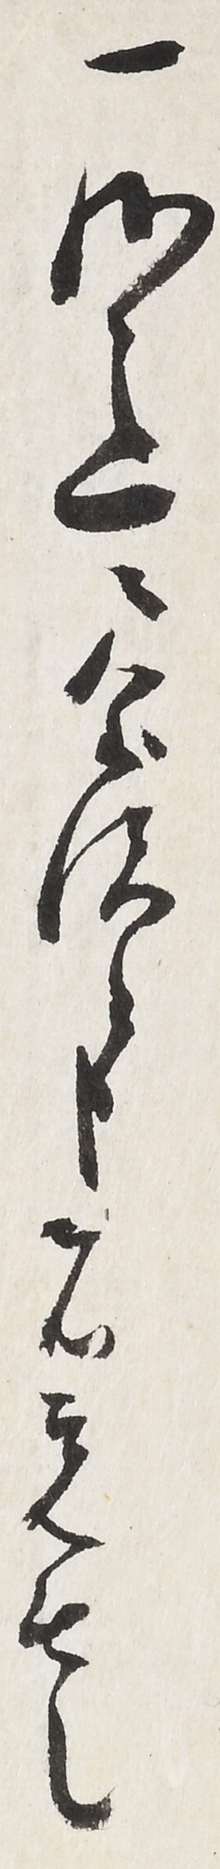一御意ニ金沢と申は覚無之
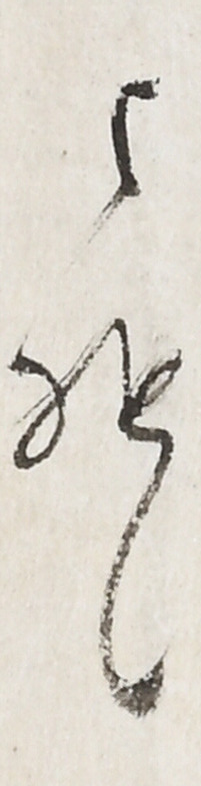被遊候
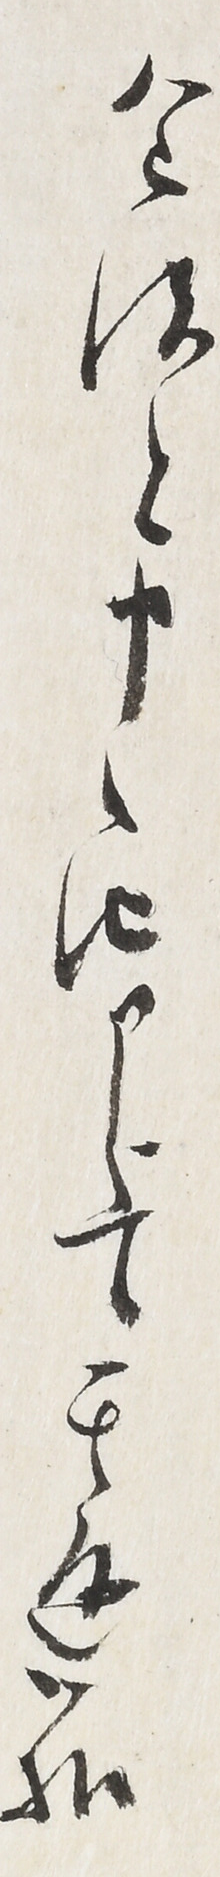金沢と申候由申上候其通御扣
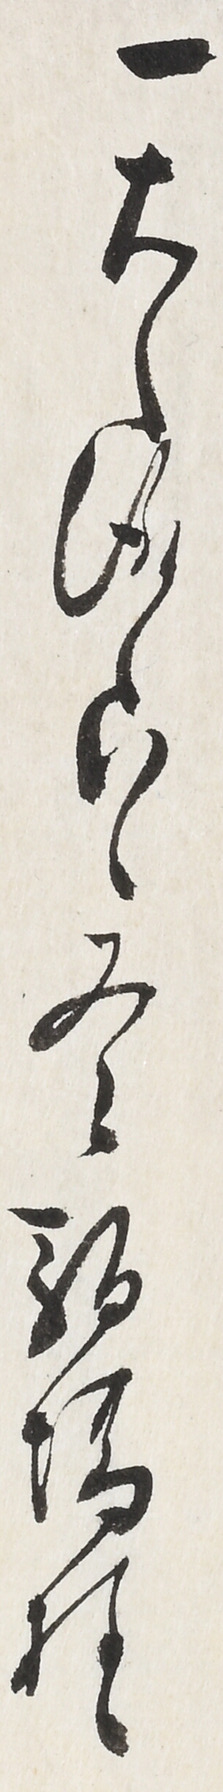一右之趣候ハヽ又々駒場村ヘ

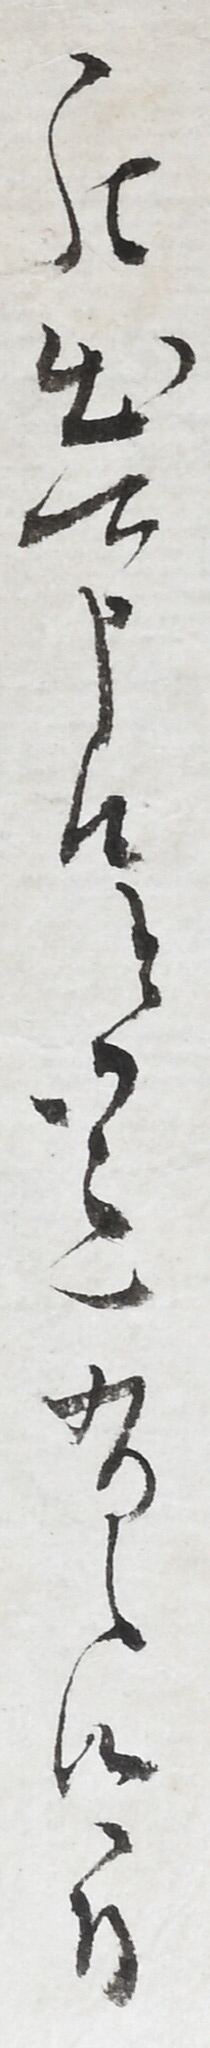罷出可申候と御意有之候ニ付
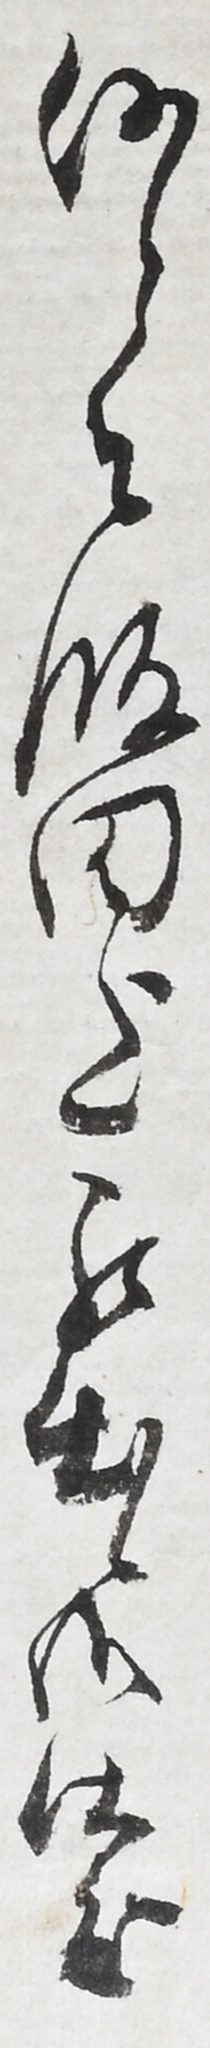何とそ飯田迄罷出候様仕度
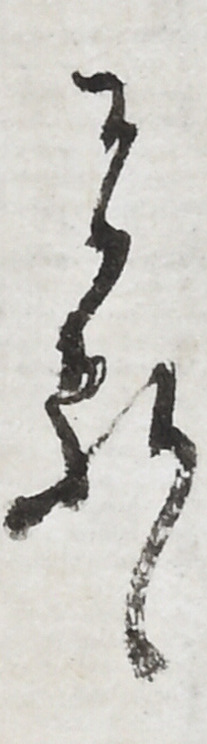奉願候
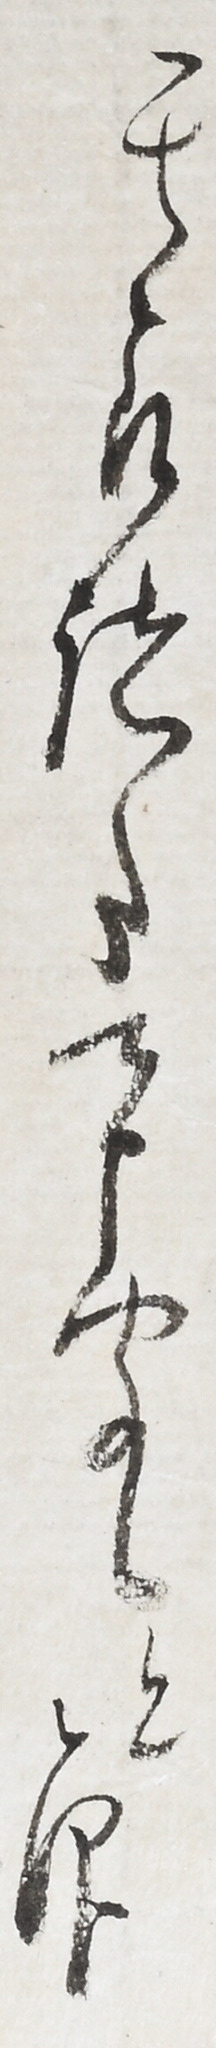其節諸事可申聞候と被仰
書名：（覚書）
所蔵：伊那市立高遠町図書館・合同会社AMANE
